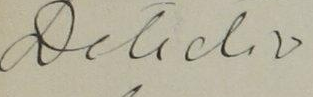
Detectiv
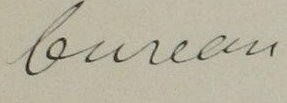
bureau
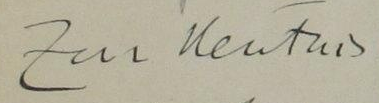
Zur Kentnis
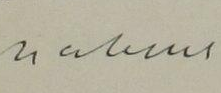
nahme
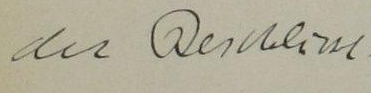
der Beschlüsse
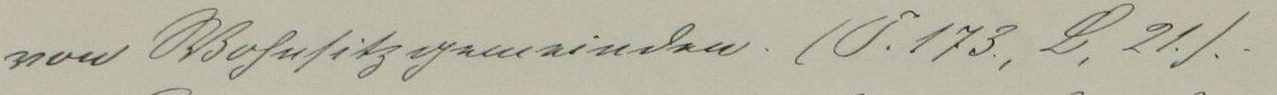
von Wohnsitzgemeinden. (T.173; L.21).
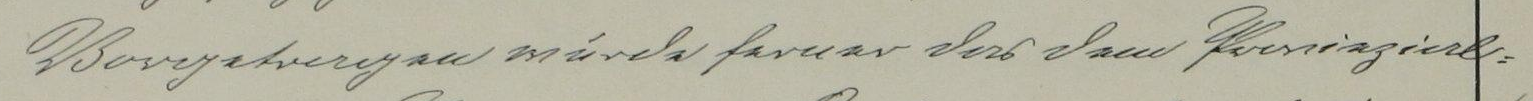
Vorgetragen wurde ferner das dem Provinzial-
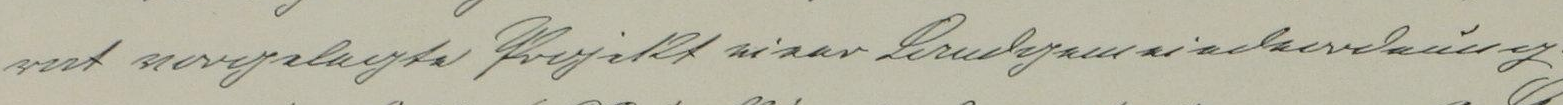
rat vorgelegte Projekt einer Landgemeindeordnung.
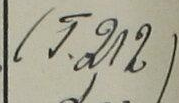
(T.212
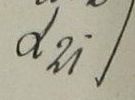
L.21)
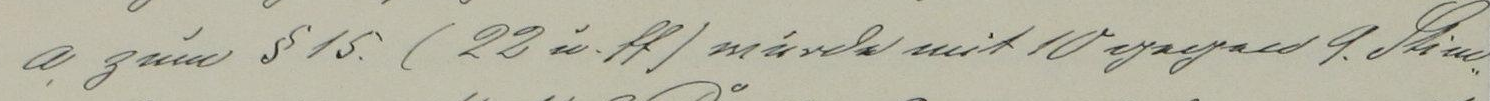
a. zum § 15 (22 u. ff.) wurde mit 10 gegen 9 Stim-
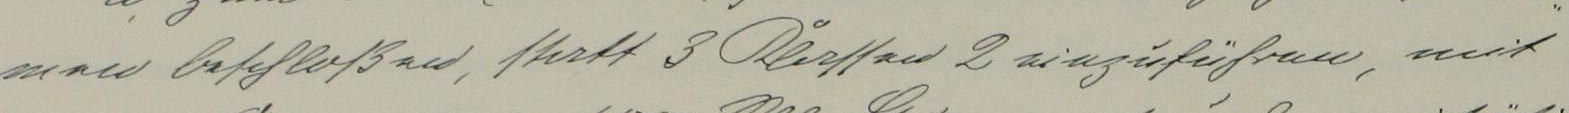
men beschloßen, statt 3 Klassen 2 einzuführen, mit
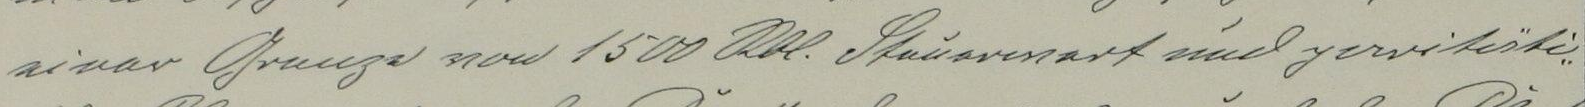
einer Grenze von 1500 Rbl. Steuerwert und paritäti-
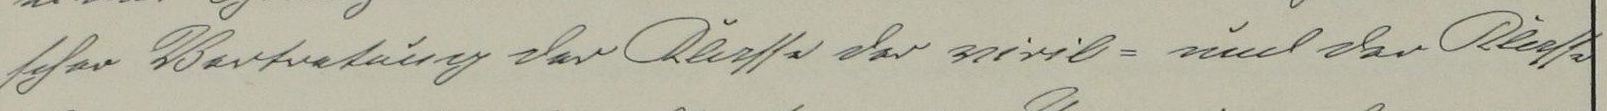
scher Vertretung der Klasse der viril- und der Klasse
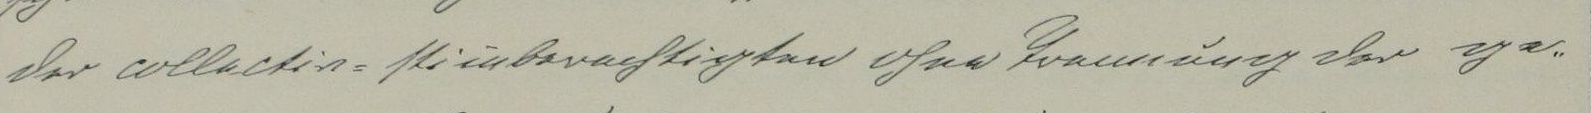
der collectiv-stimmberechtigten ohne Trennung der ge-
